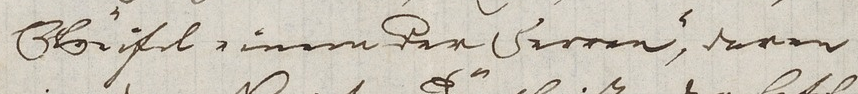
Zweifel einem der «Herren», deren
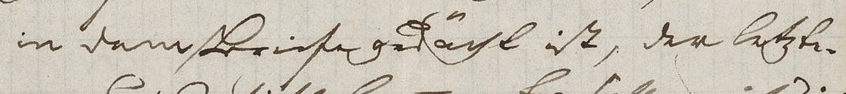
in dem Briefe gedacht ist, der letzte-
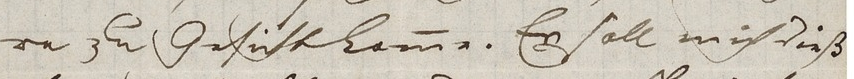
re zu Gesicht komme. Es soll mich dieß
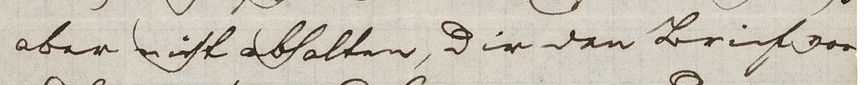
aber nicht abhalten, Dir den Brief vor-
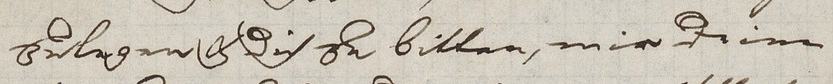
zulegen & Dich zu bitten, mir Deine
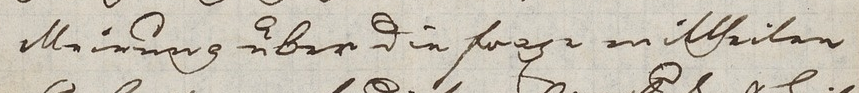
Meinung über die Frage mittheilen
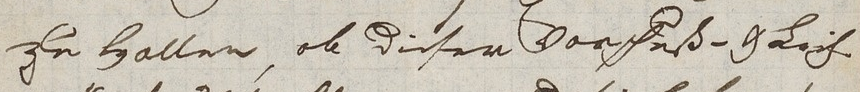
zu wollen, ob dieser Vorschuß- & Leih-
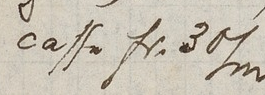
casse Fr. 30/m
